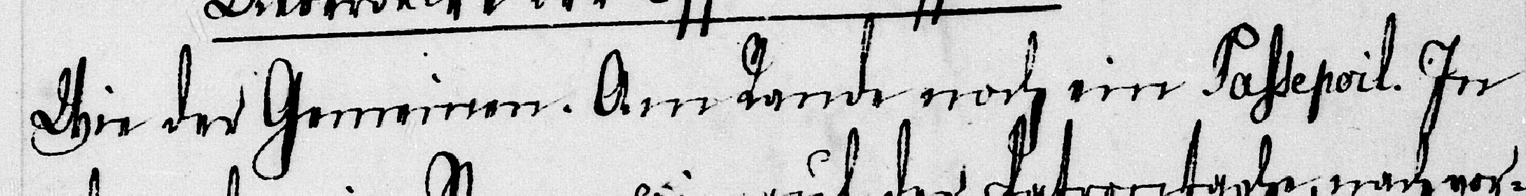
Wie der Gemeinen. Am Rande noch ein Passepoil. In
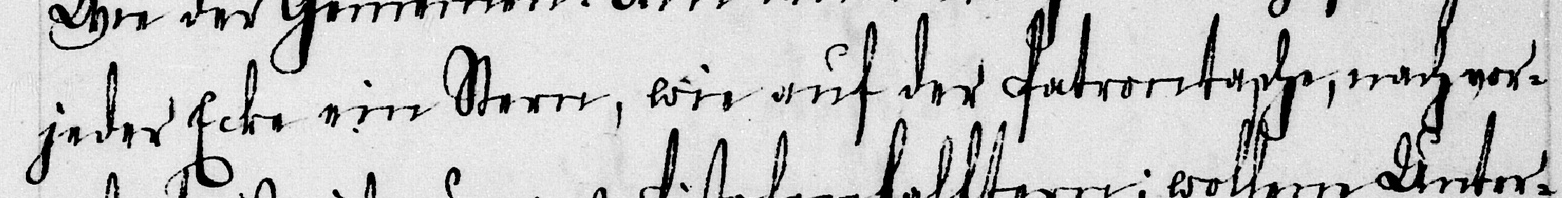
jeder Ecke ein Stern, wie auf der Patrontasche, nach vor¬
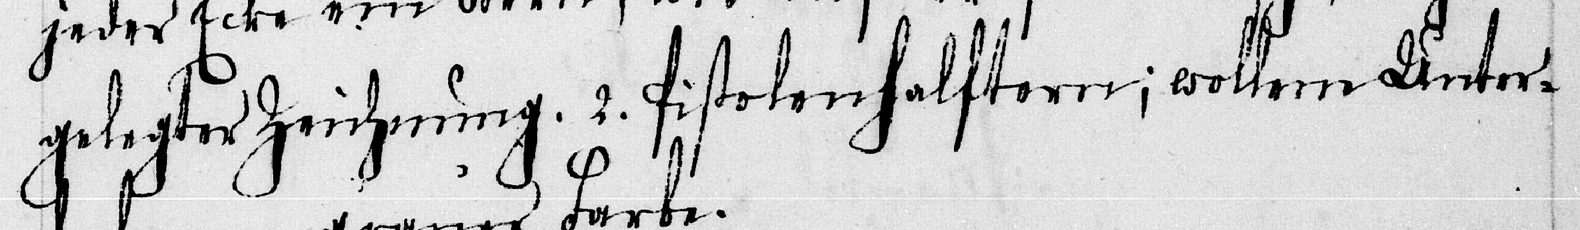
gelegter Zeichnung. 2. Pistolenhalftern; wollene Unter¬
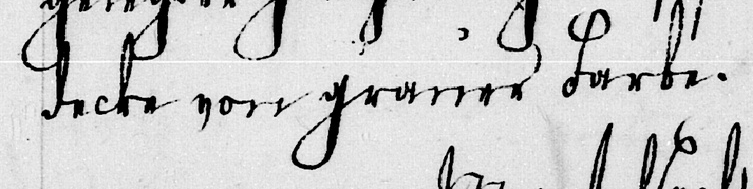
decke von grauer Farbe.
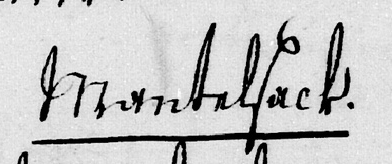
Mantelsack.
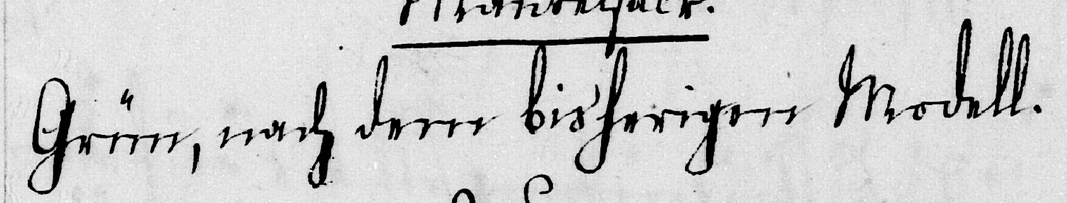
Grün, nach dem bisherigen Modell.
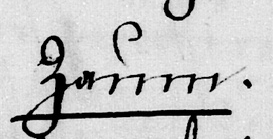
Zaum.
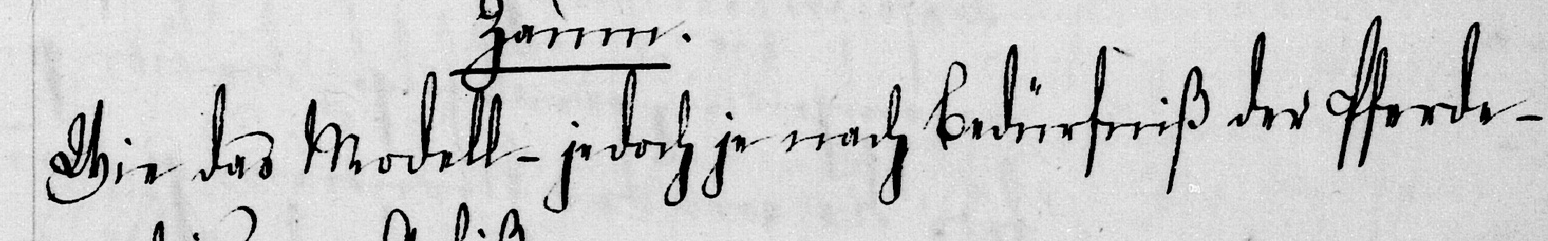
Wie das Modell – jedoch nach Bedürfniß der Pferde
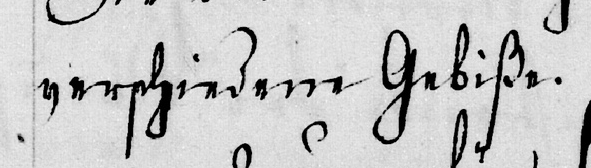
verschiedene Gebiße.
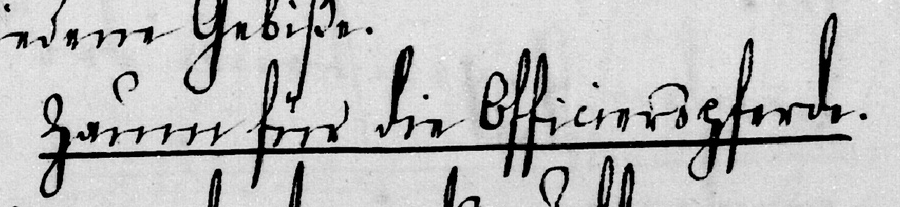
Zaum für die Officierspferde.
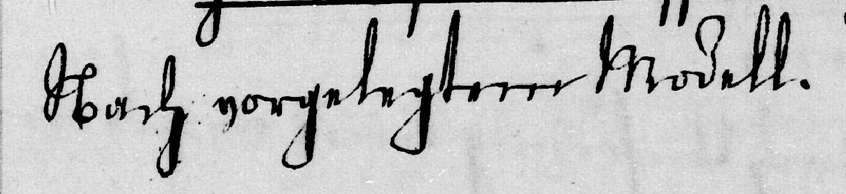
Nach vorgelegtem Modell.
